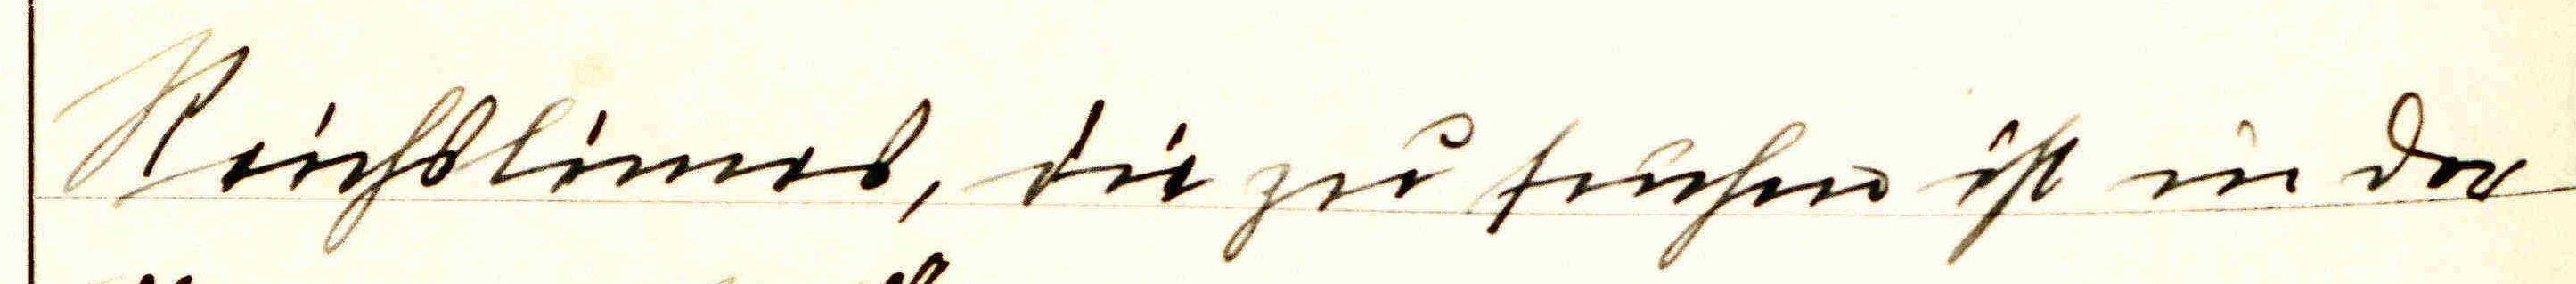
Reichslimes, die zu suchen ist in der
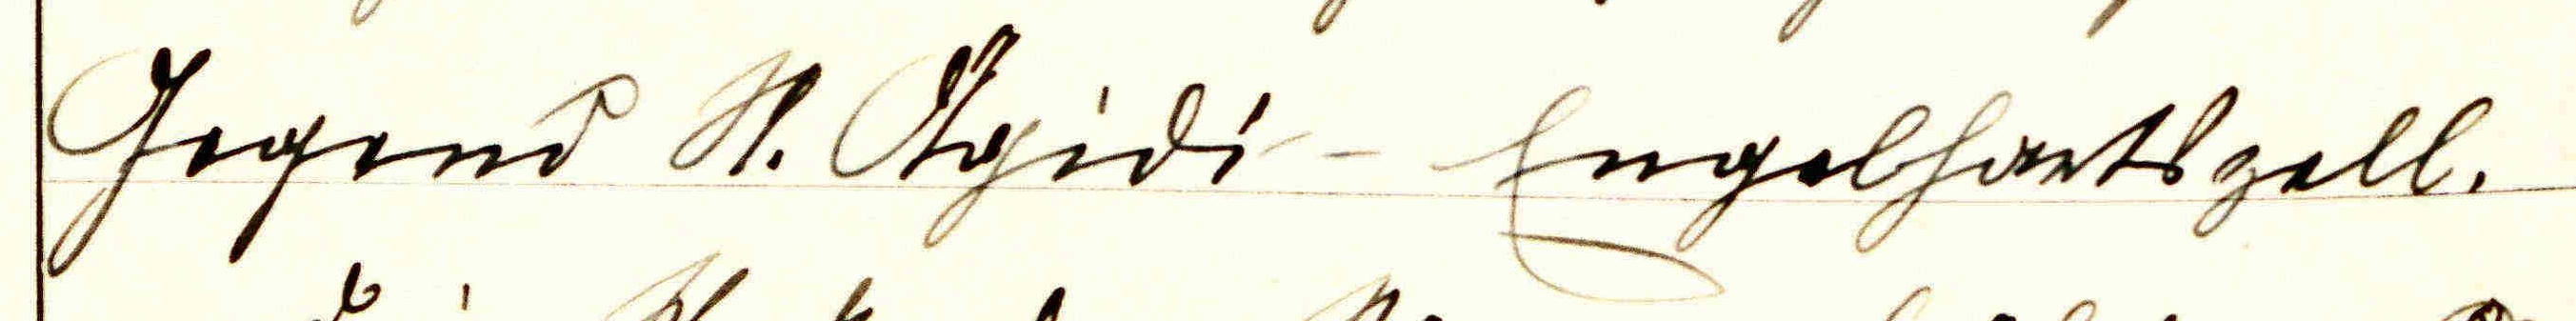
Gegend St. Ägidi – Engelhartszell.
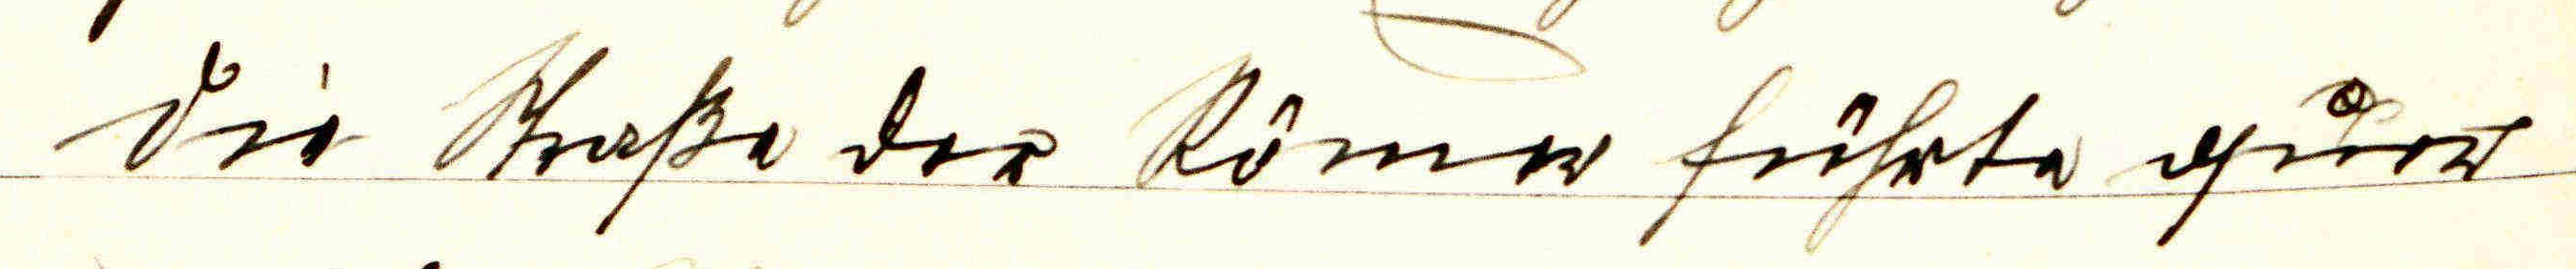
Die Straße der Römer führte quer
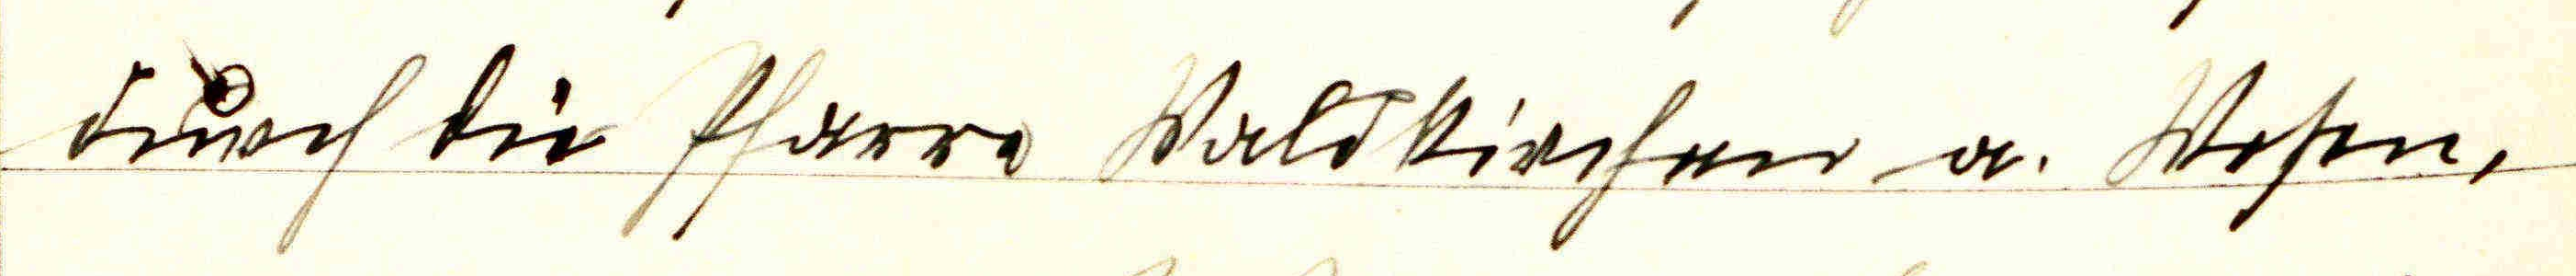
durch die Pfarre Waldkirchen a. Wesen,
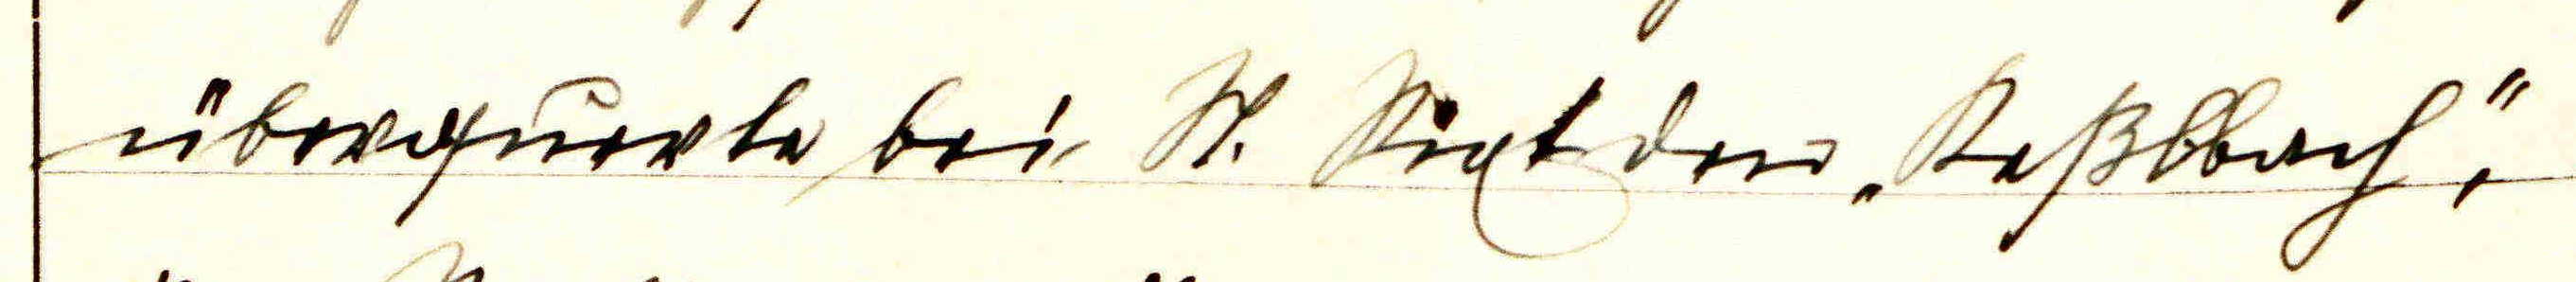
überquerte bei St. Sixt den „Keßlbach“,
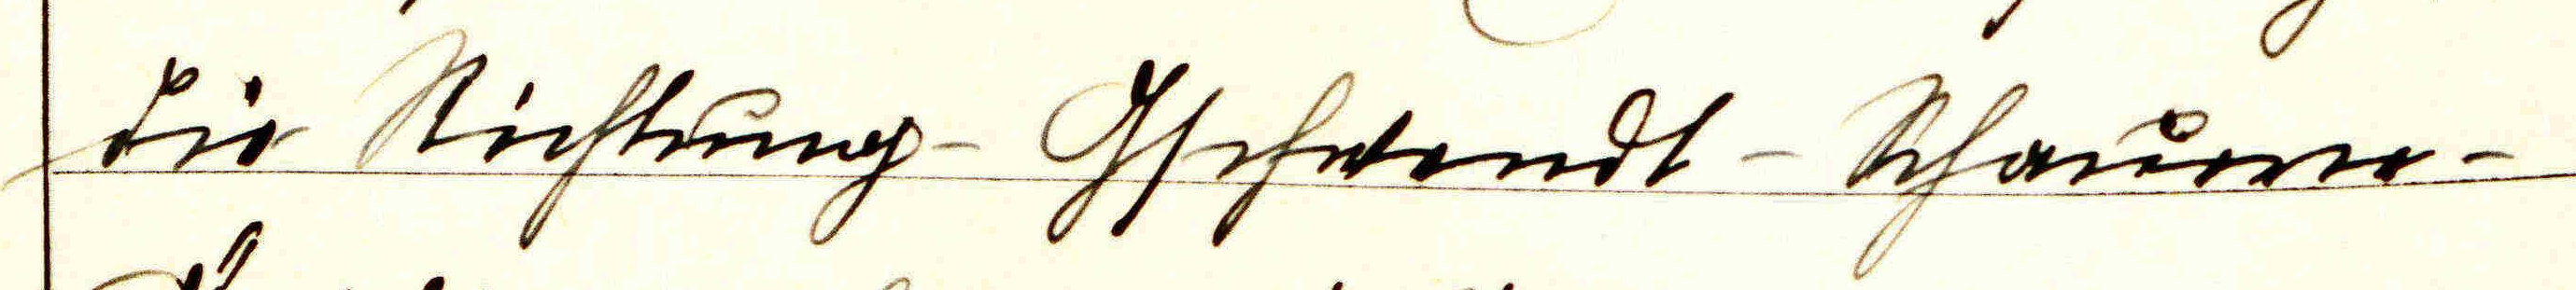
die Richtung Gschwendt – Schauern -
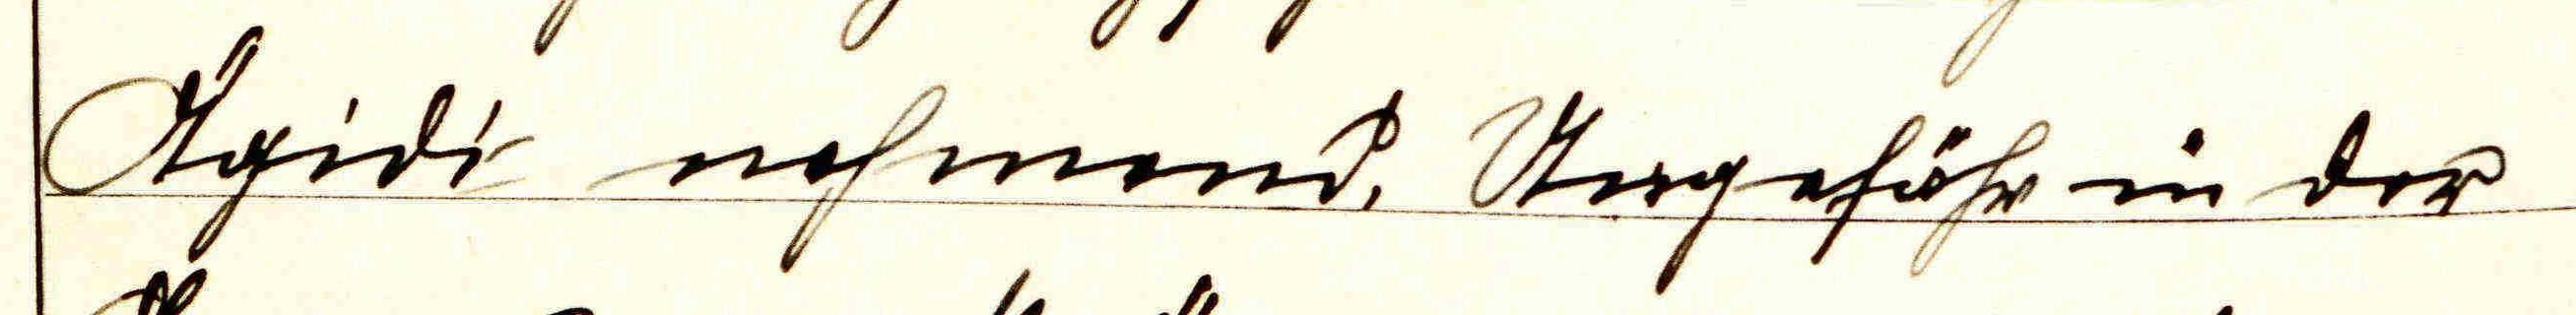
Ägidi nehmend. Ungefähr in der
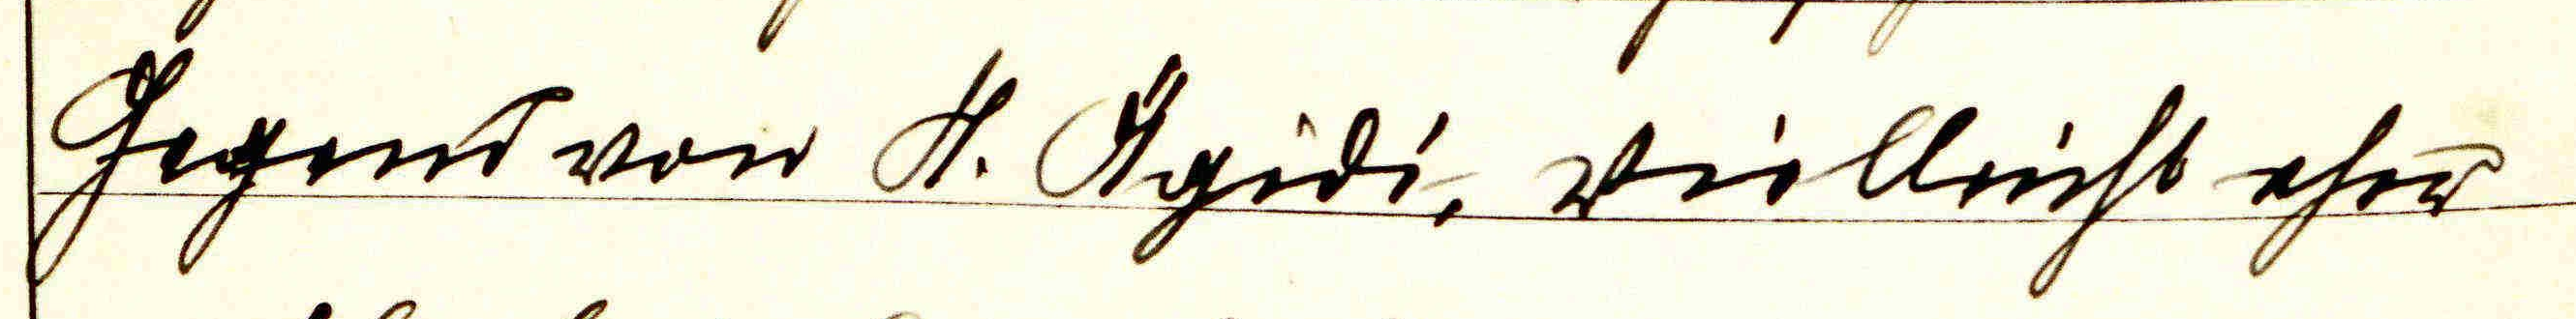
Gegend von St. Ägidi, vielleicht eher
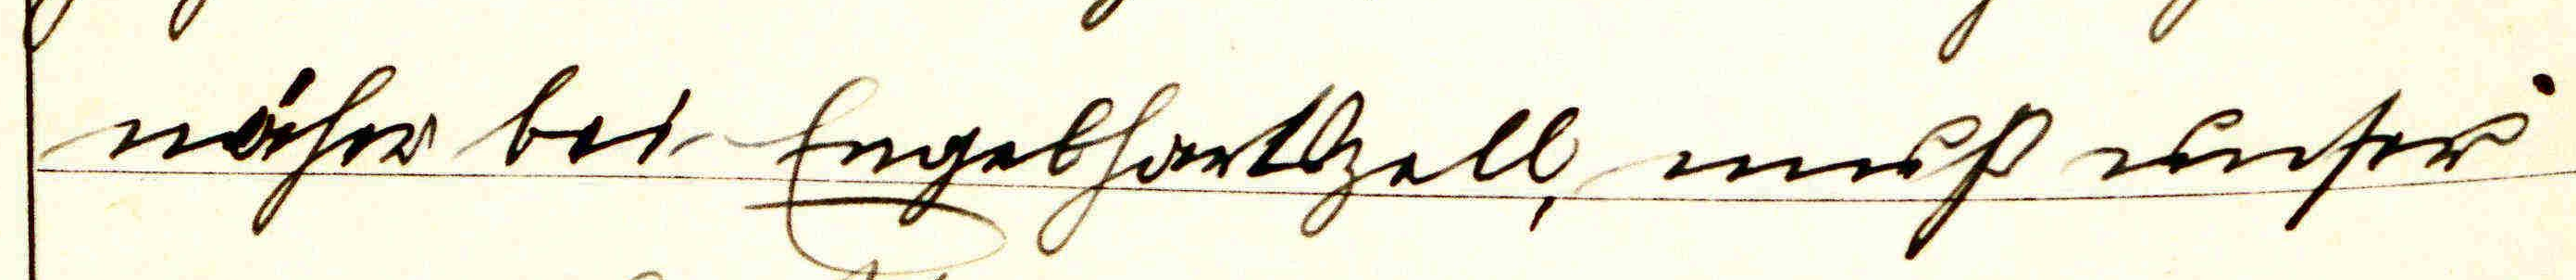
näher bei Engelhartszell, muß unser
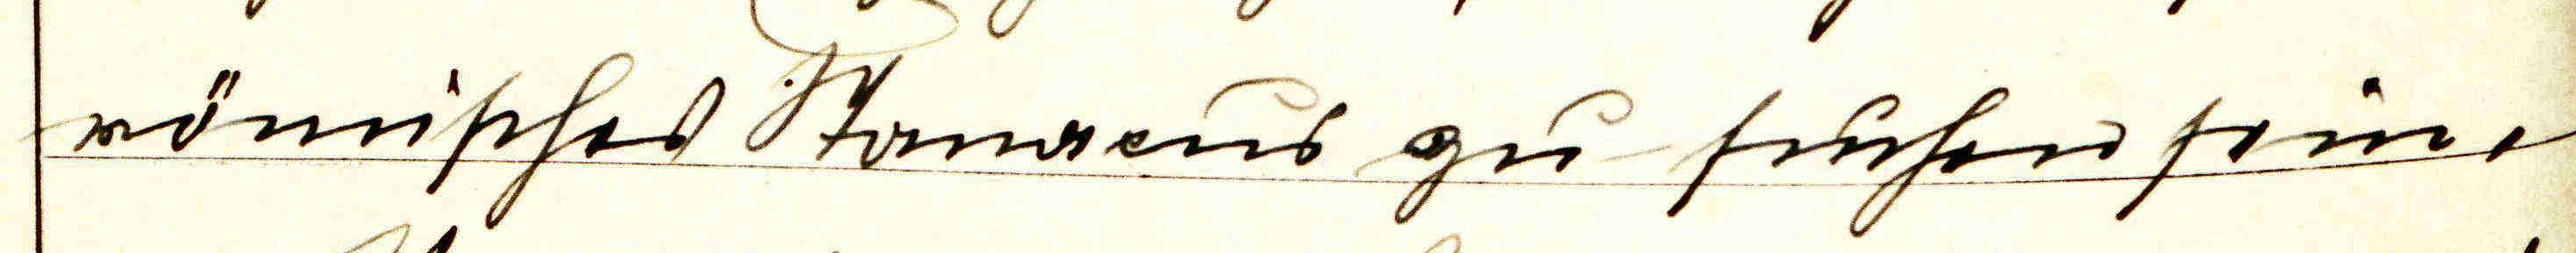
römisches Stanacus zu suchen sein.
